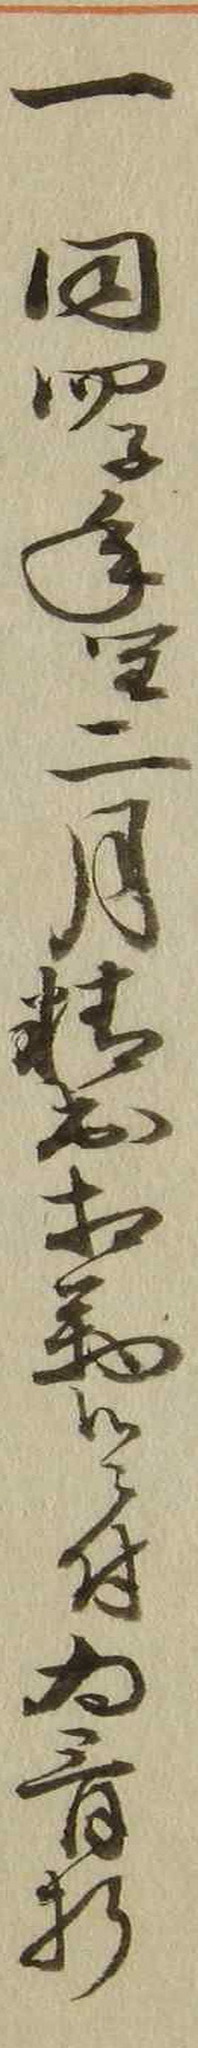一同四子年閏二月精出相勤候ニ付為骨折
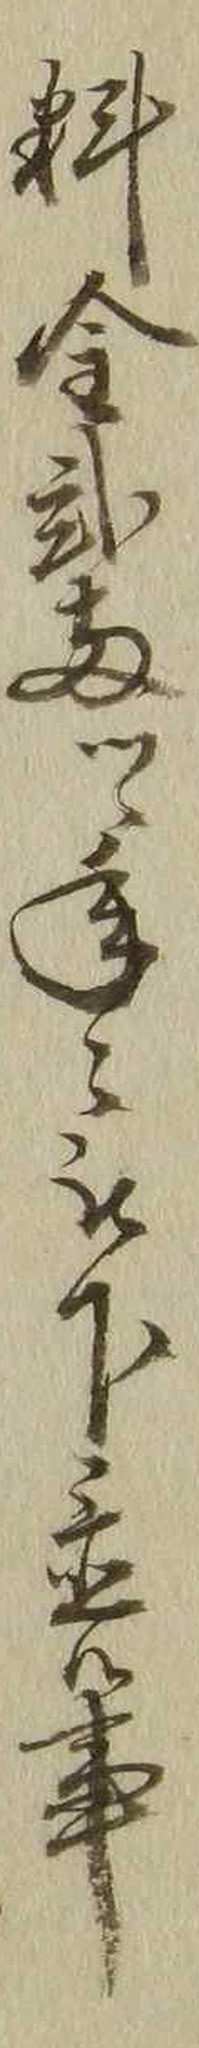料金弐両ツヽ年々被下置候事
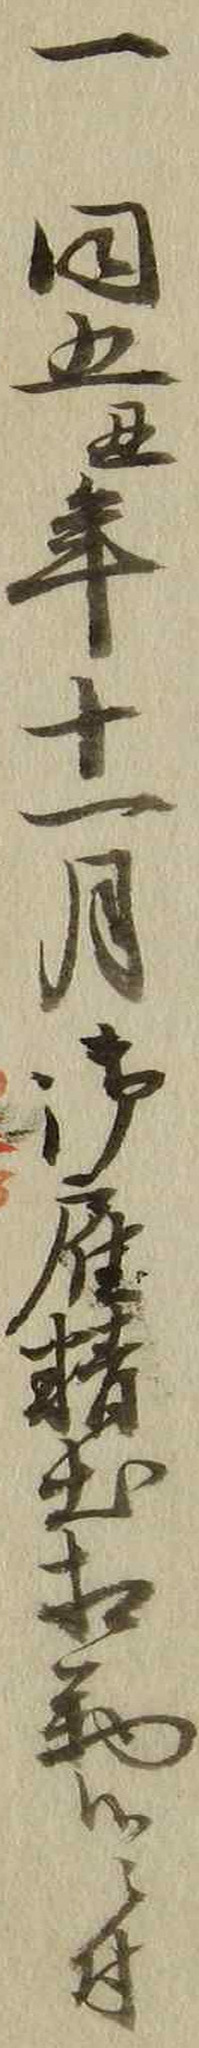一同五丑年十一月御雇精出相勤候ニ付
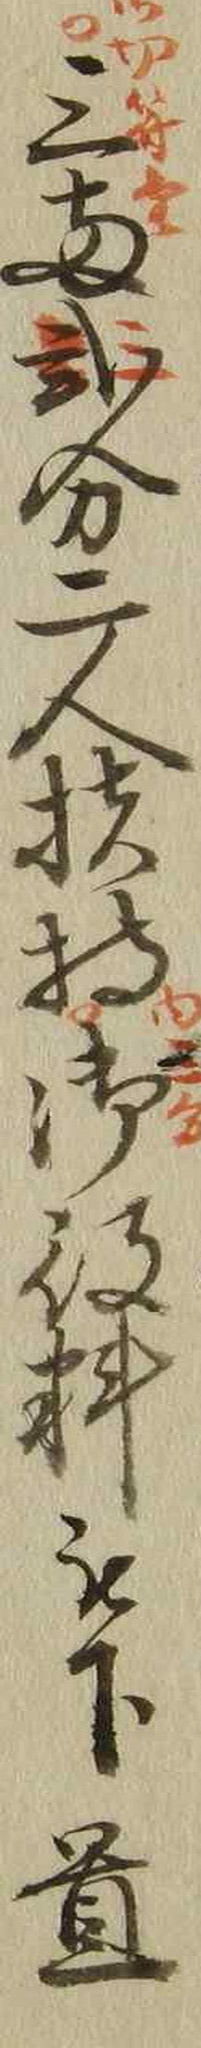三両弐分弐人扶持御役料被下置
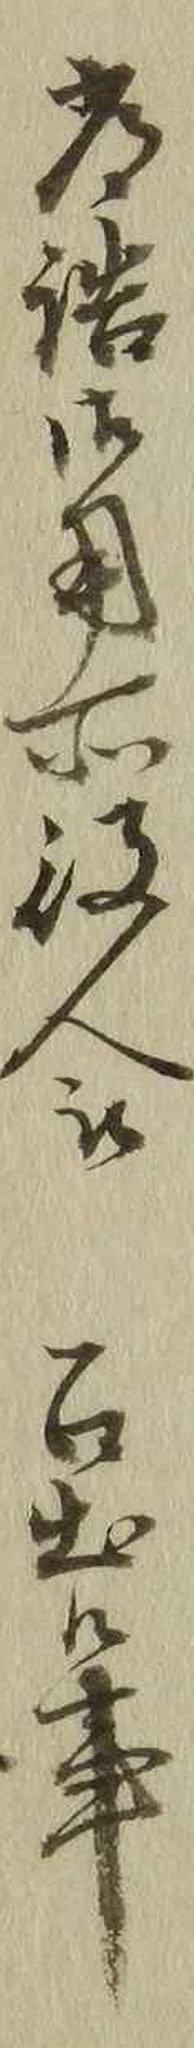常詰御用所役人被召出候事
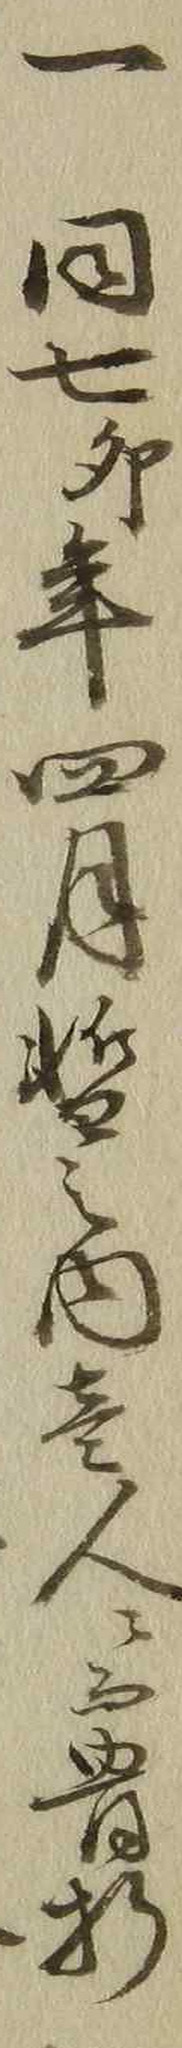一同七卯年四月暫之内壱人ニ而骨折
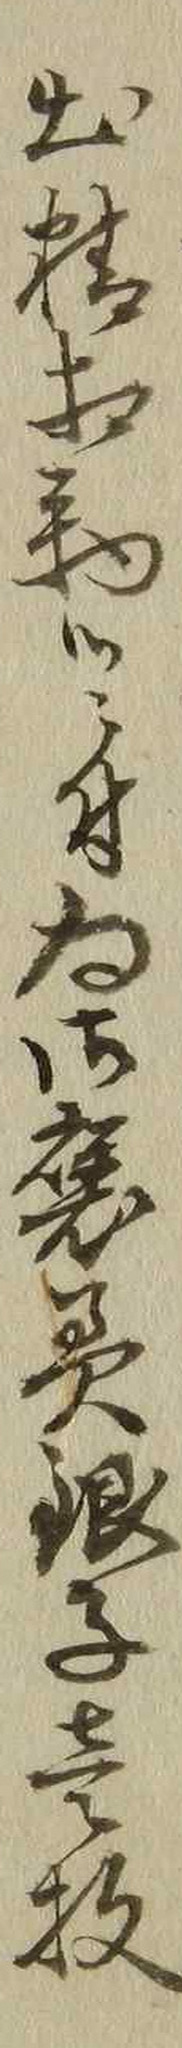出精相勤候ニ付為御褒美銀子壱枚
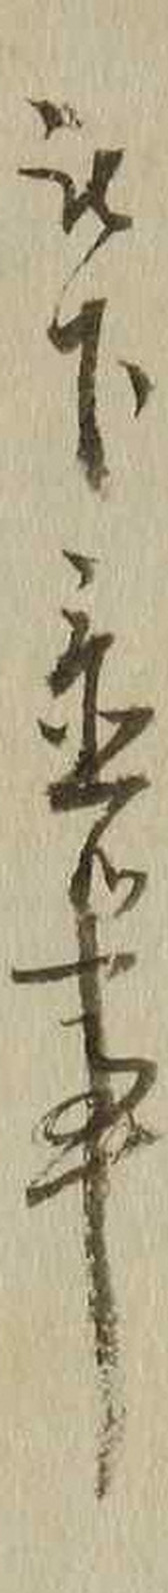被下置候事
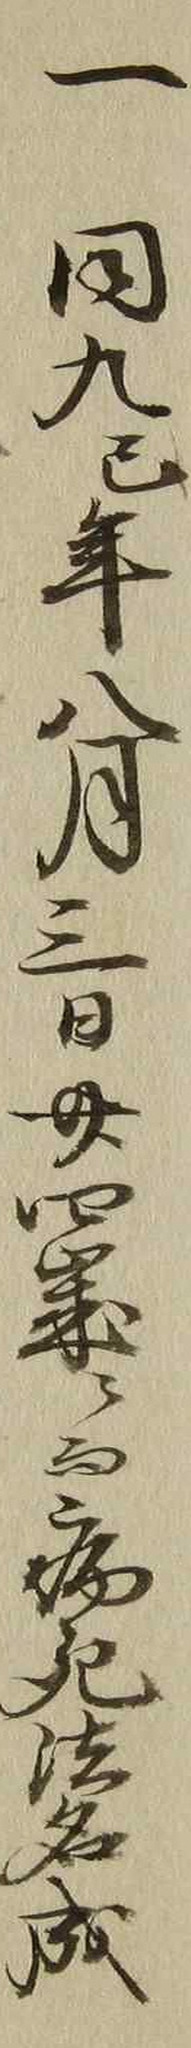一同九巳年八月三日廿四歳ニ而病死法名成
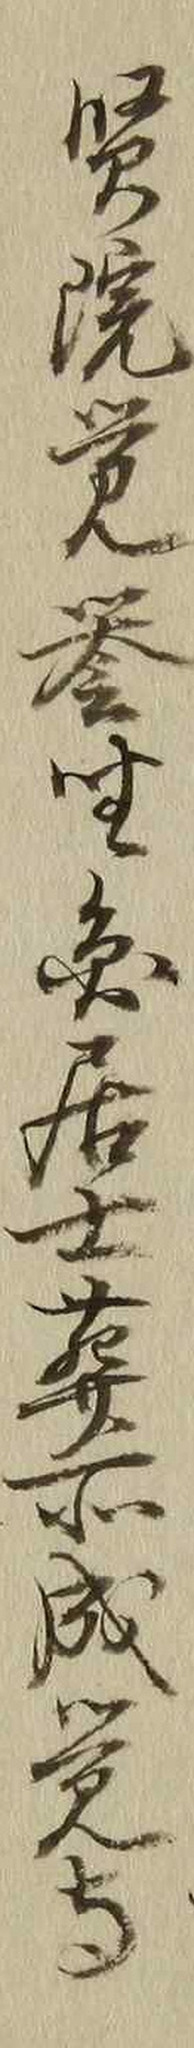賢院覚誉座円居士葬所成覚寺
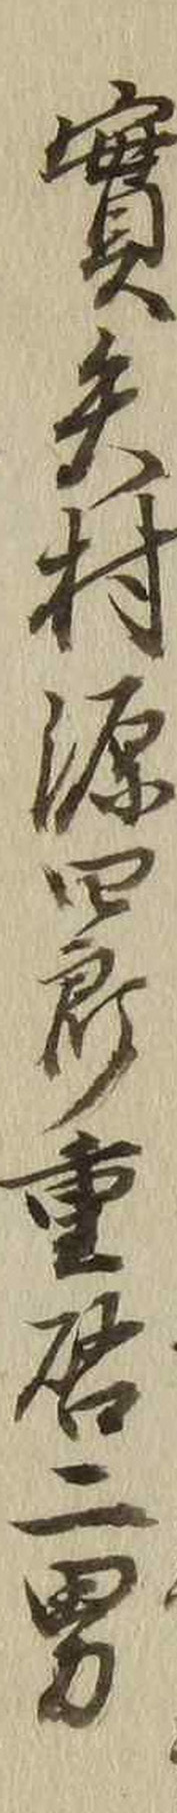実矢村源四郎重啓二男
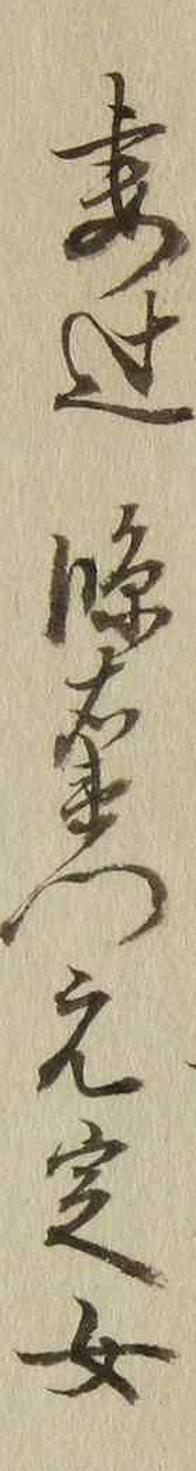妻辻臨右衛門元定女
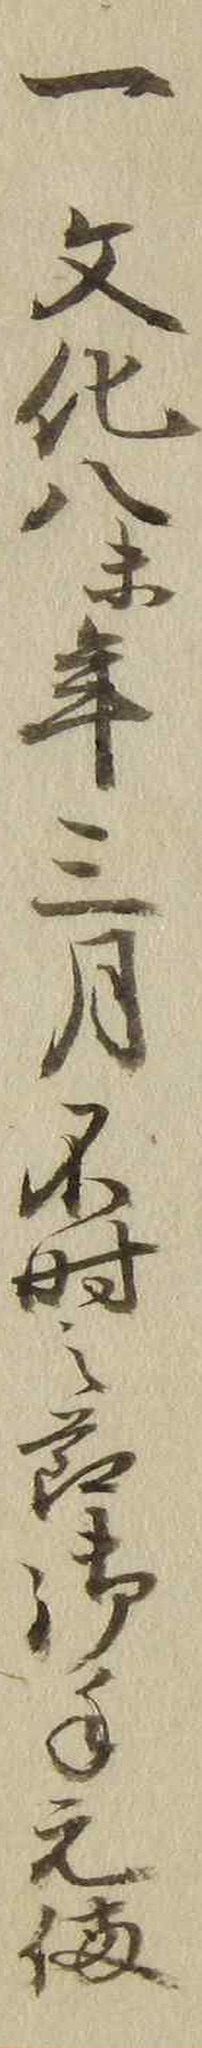一文化八未年三月不時之節御手元備
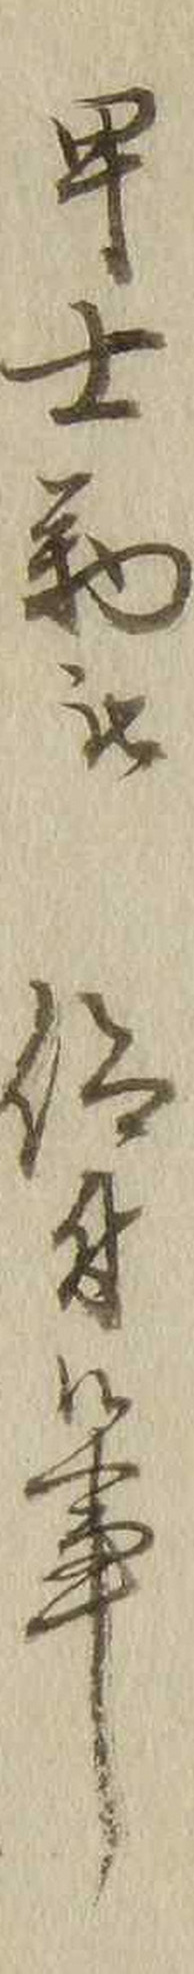甲士勤被仰付候事
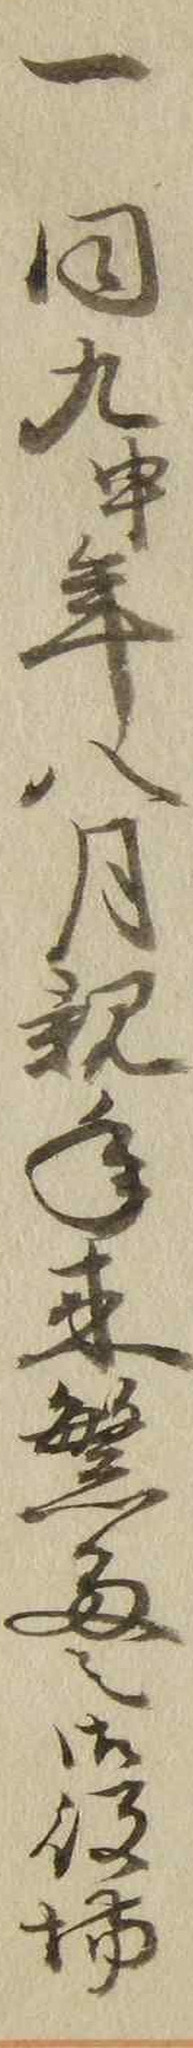一同九申年八月親年来繫多之御役場

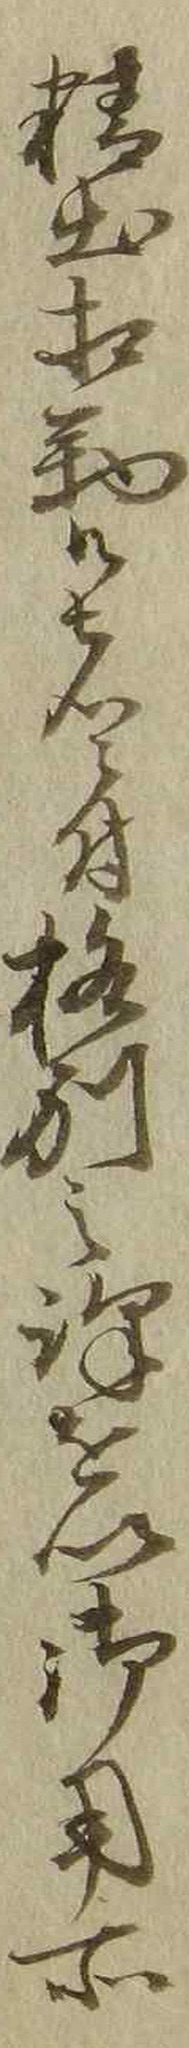精出相勤候者ニ付格別之訳を以御用所
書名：諸士系譜　巻之64　と之部7
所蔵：会津若松市立会津図書館
